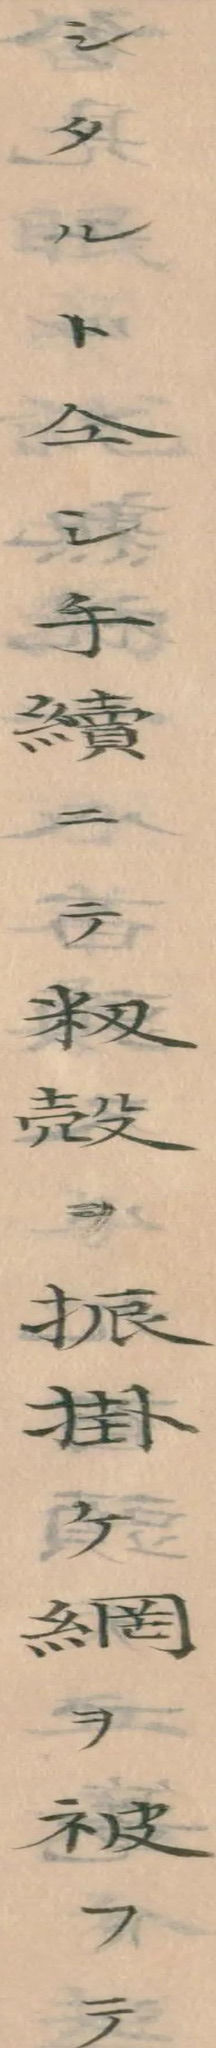シタルト仝シ手続ニテ籾殻ヲ振掛ケ網ヲ被フテ
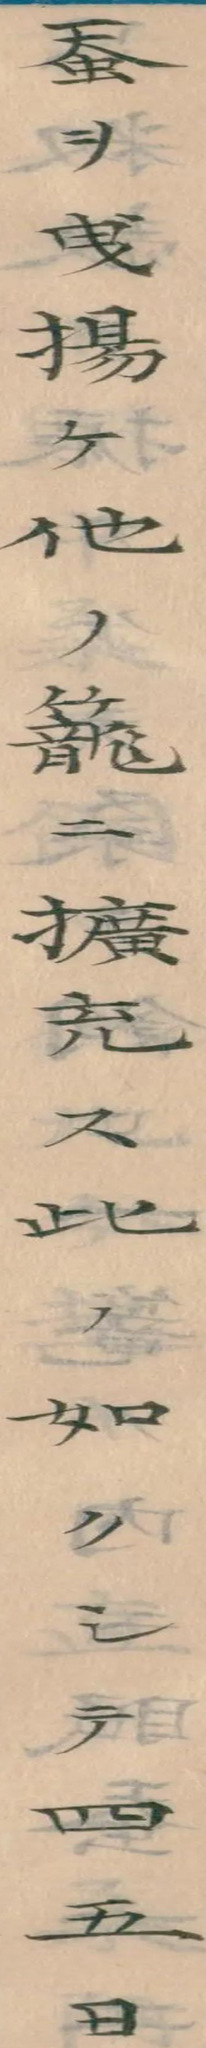蚕ヲ曳揚ケ他ノ籠ニ拡充ス此ノ如クシテ四五日
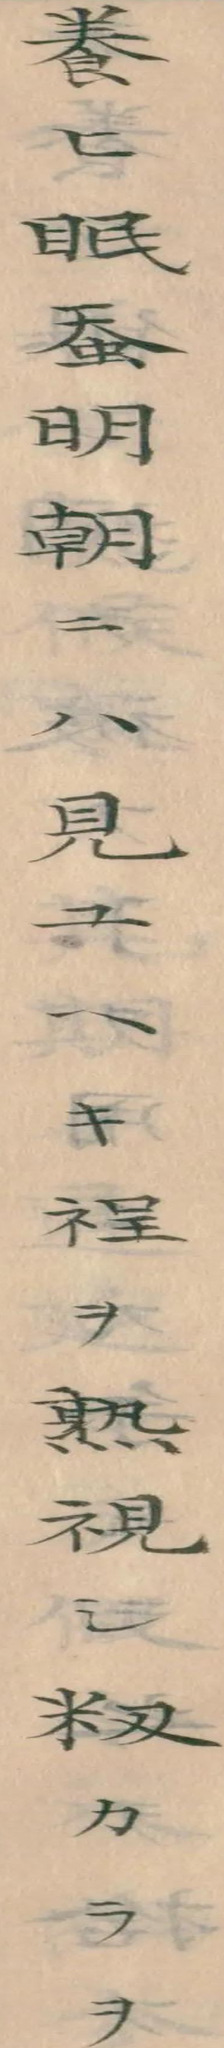養ヒ眠蚕明朝ニハ見ユヘキ程ヲ熟視シ籾カラヲ
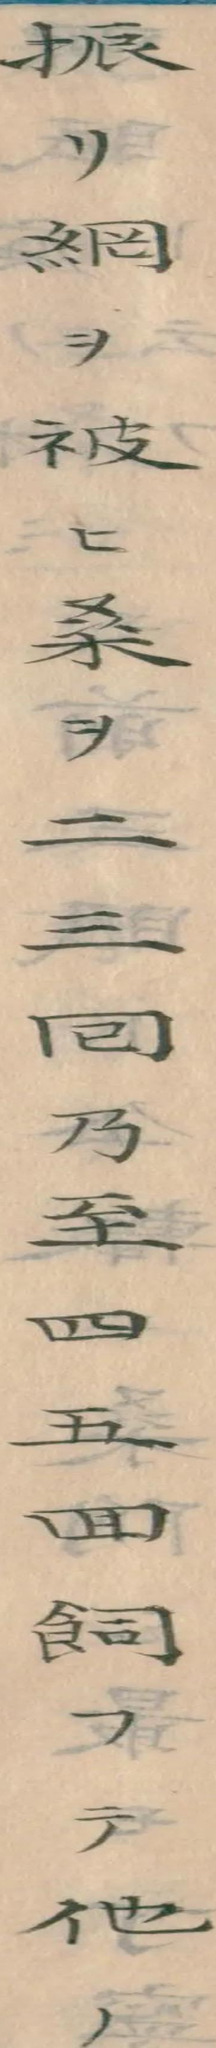振リ網ヲ被ヒ桑ヲ二三回乃至四五回飼フテ他ノ
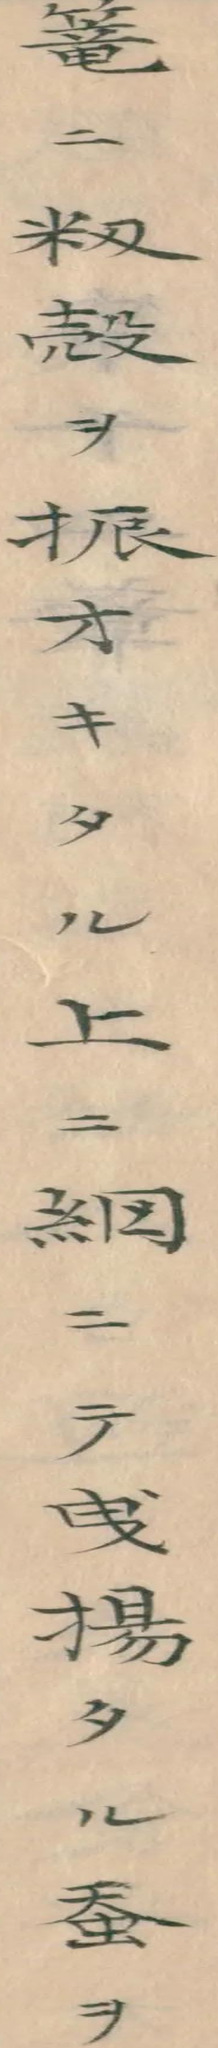篭ニ籾穀ヲ振オキタル上ニ網ニテ曳揚タル蚕ヲ
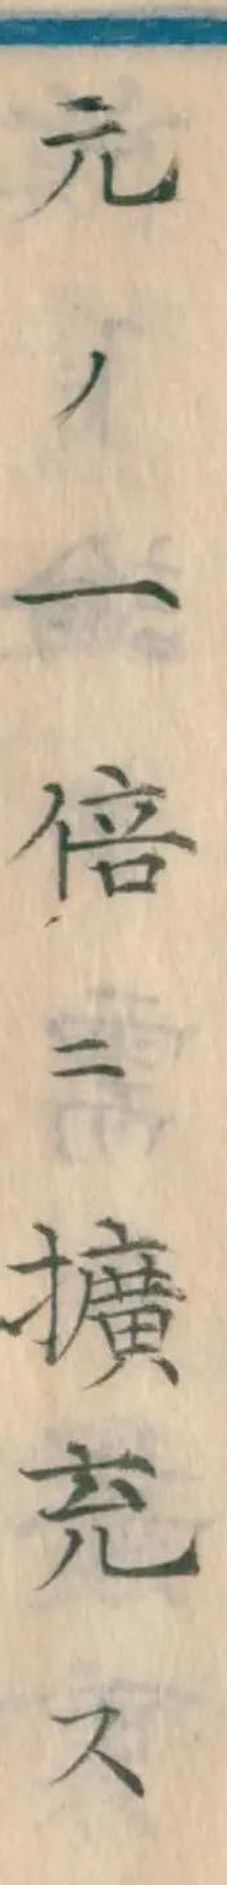元ノ一倍ニ拡充ス
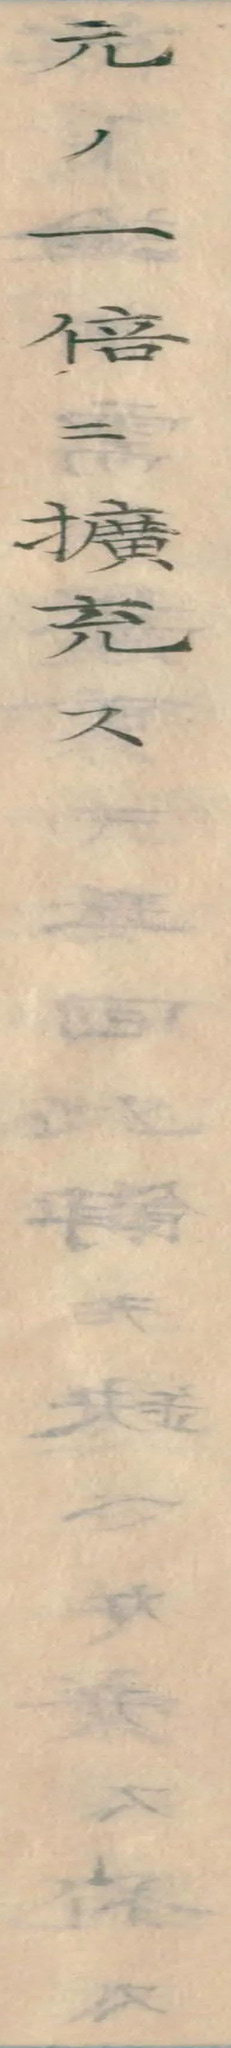元ノ一倍ニ拡充ス
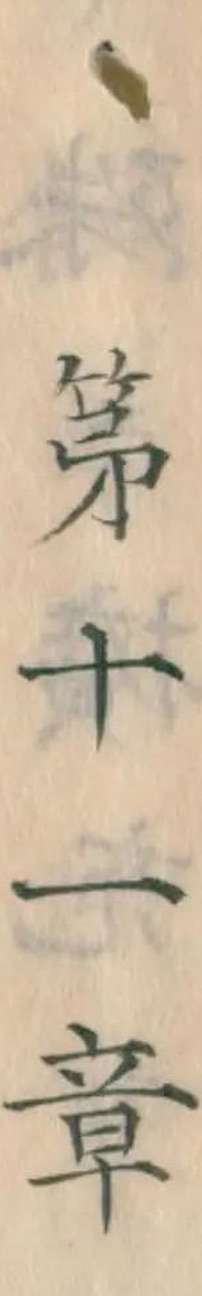第十一章
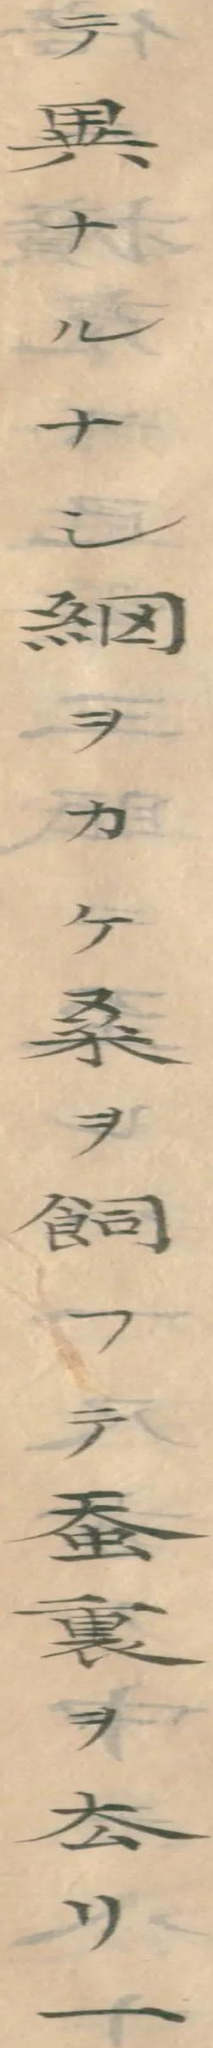テ異ナルナシ網ヲカケ桑ヲ飼フテ蚕裏ヲ去リ一

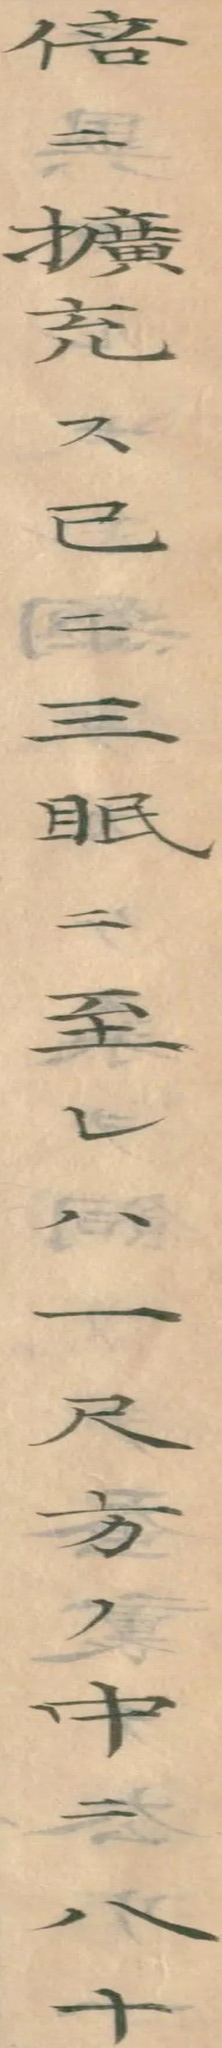倍ニ拡充ス已ニ三眠ニ至レハ一尺方ノ中ニ八十
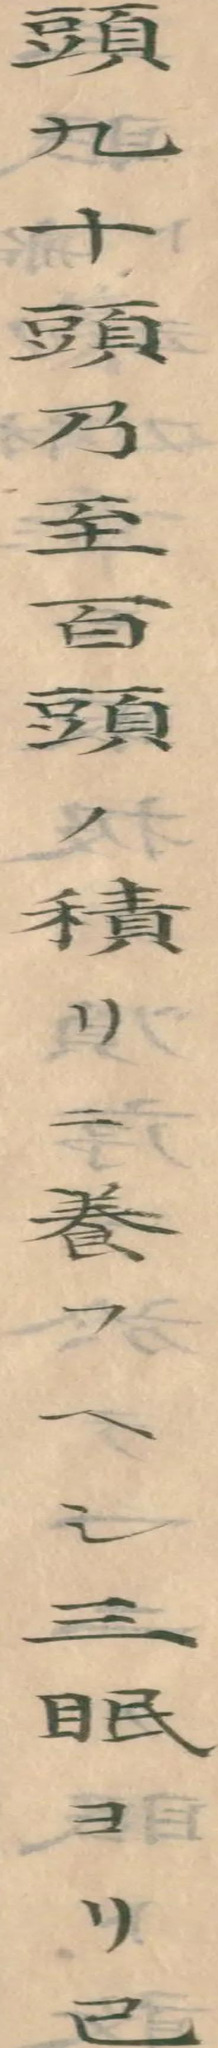頭九十頭乃至百頭ノ積リニ養フヘシ三眠ヨリ已
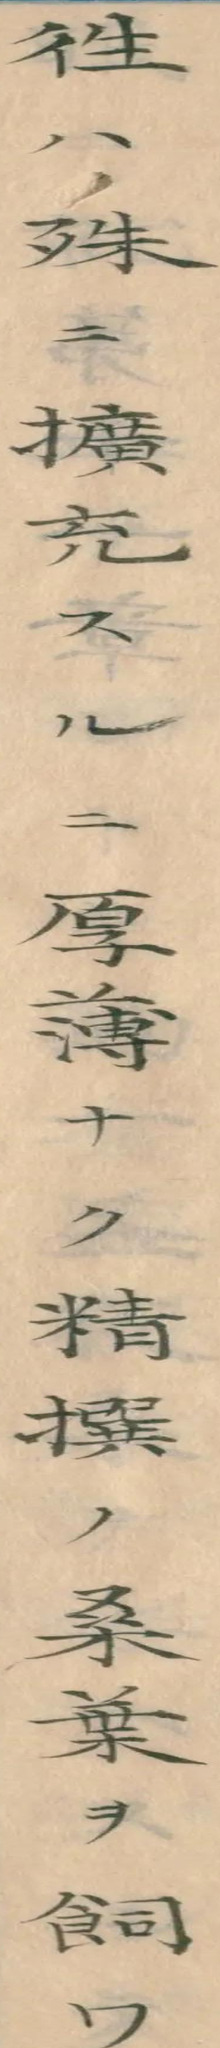往ハ殊ニ拡充スルニ厚薄ナク精撰ノ桑葉ヲ飼ワ
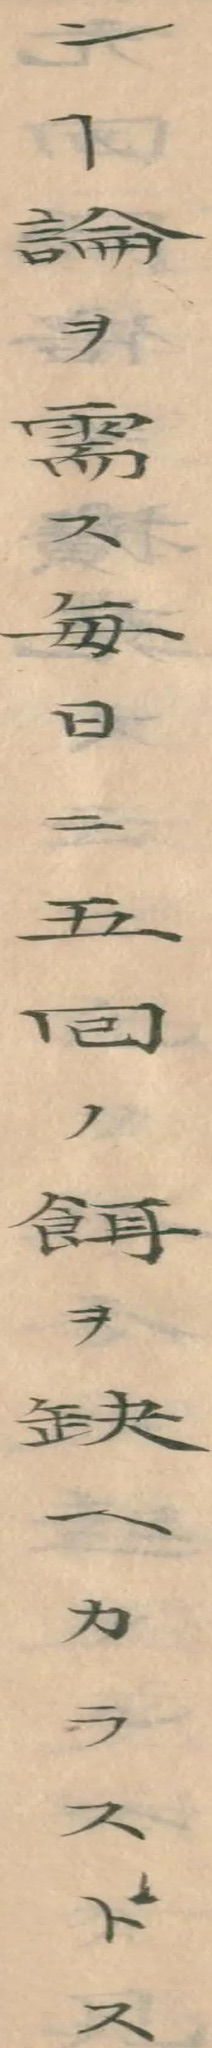ンコト論ヲ需ス毎日ニ五回ノ餌ヲ欠ヘカラストス
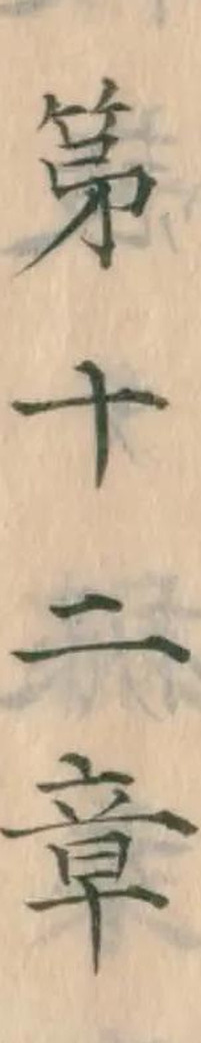第十二章
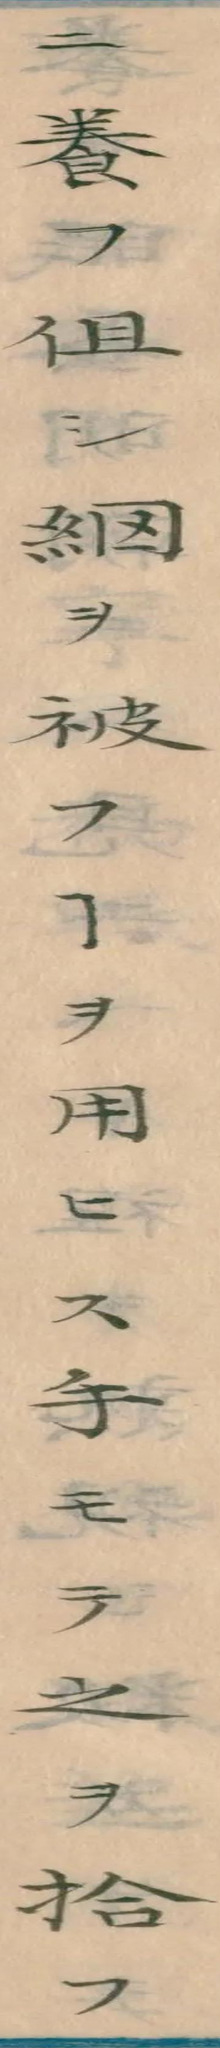ニ養フ但シ網ヲ被フコトヲ用ヒス手モテ之ヲ拾フ
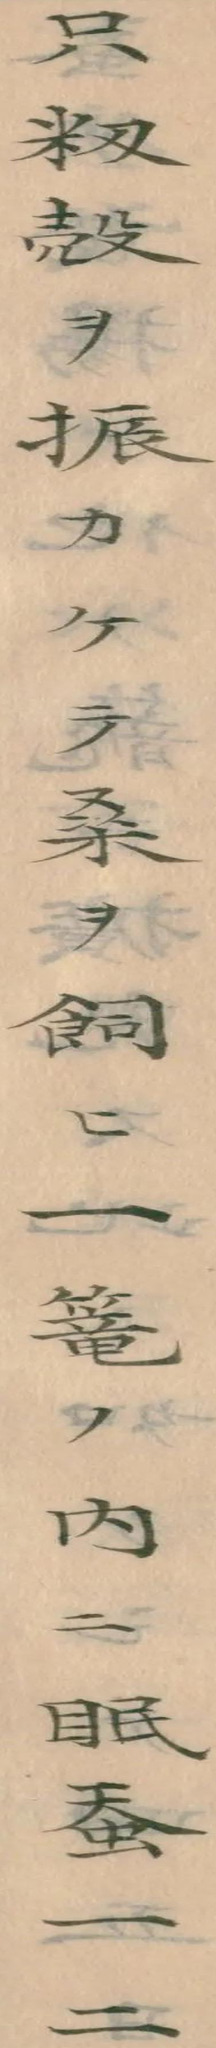只籾殻ヲ振カケテ桑ヲ飼ヒ一篭ノ内ニ眠蚕一二
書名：蚕桑集成
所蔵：国立国会図書館 National Diet Library, JAPAN
